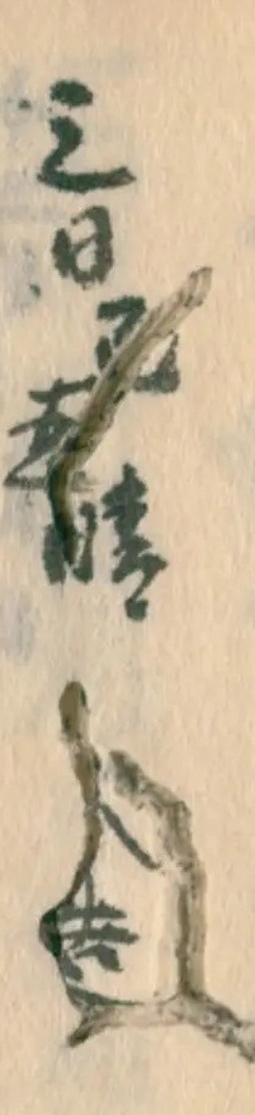三日己丑晴
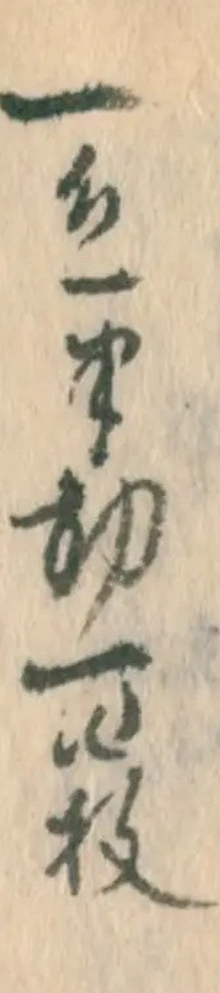一色半切百枚
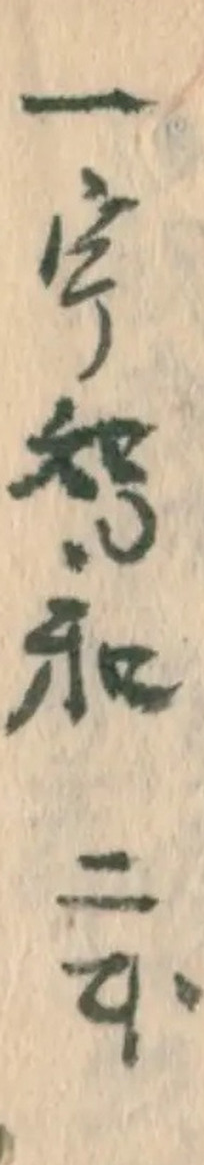一宇智和二本
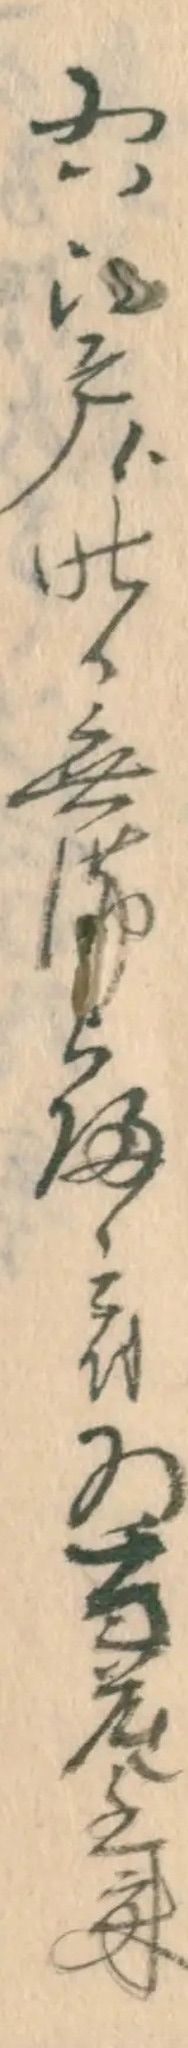右江戸ゟ昨日無滞被帰候ニ付為土産到来
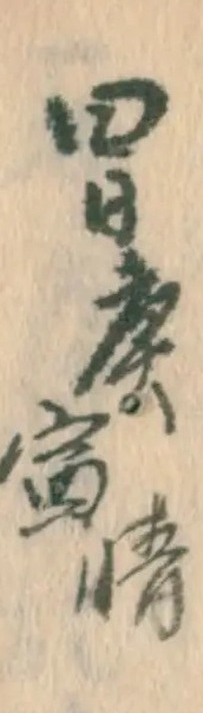四日庚寅晴
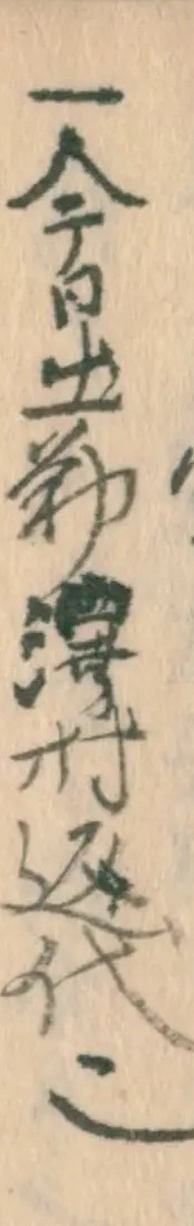一今日出勤沢村返代也
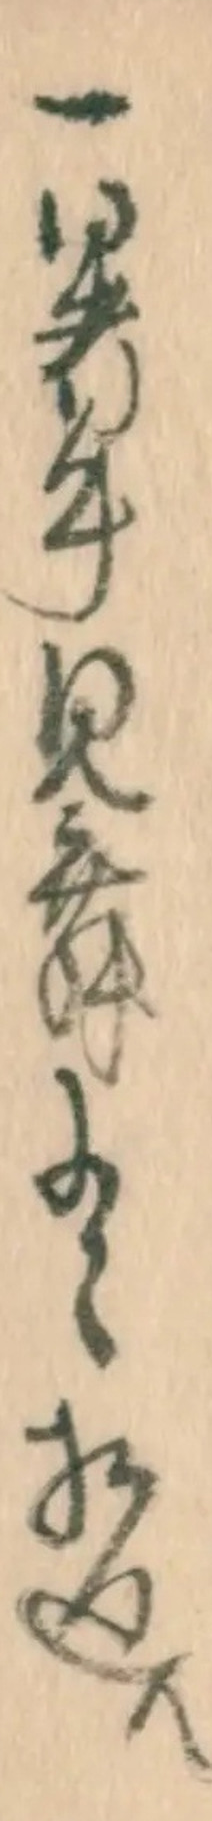一暑中見舞少々相廻ル
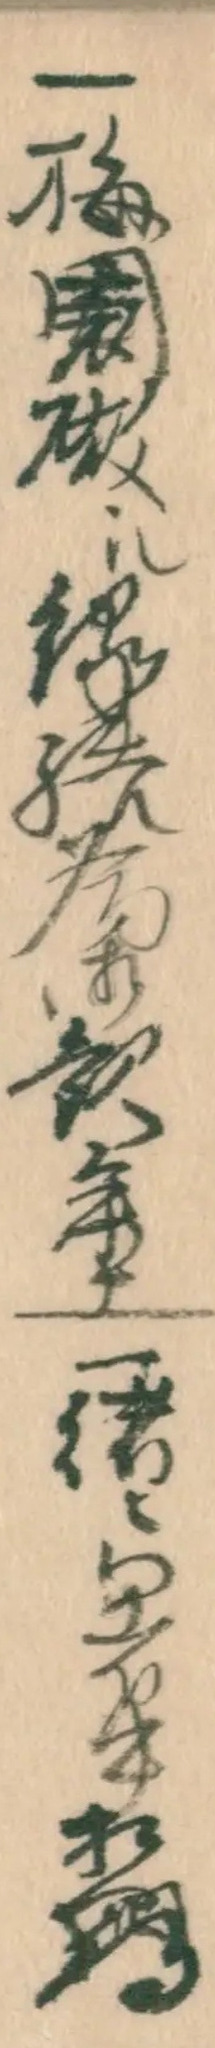一梅園殿え縁結為御歓参上一緒ニ暑中相尋
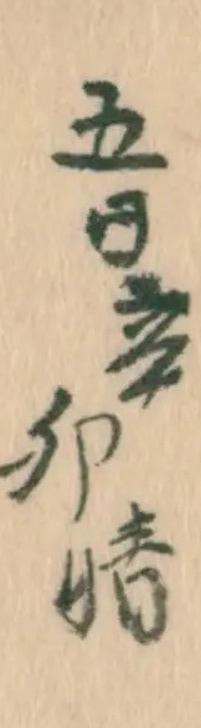五日辛卯晴
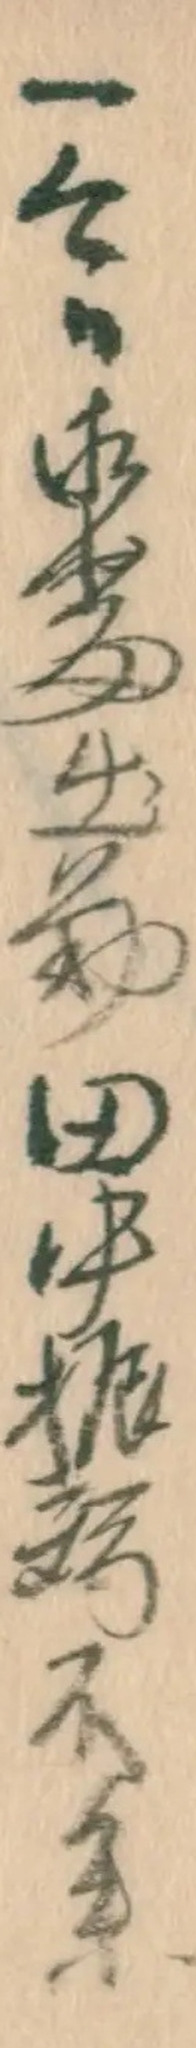一今日御番出勤田中振替不参
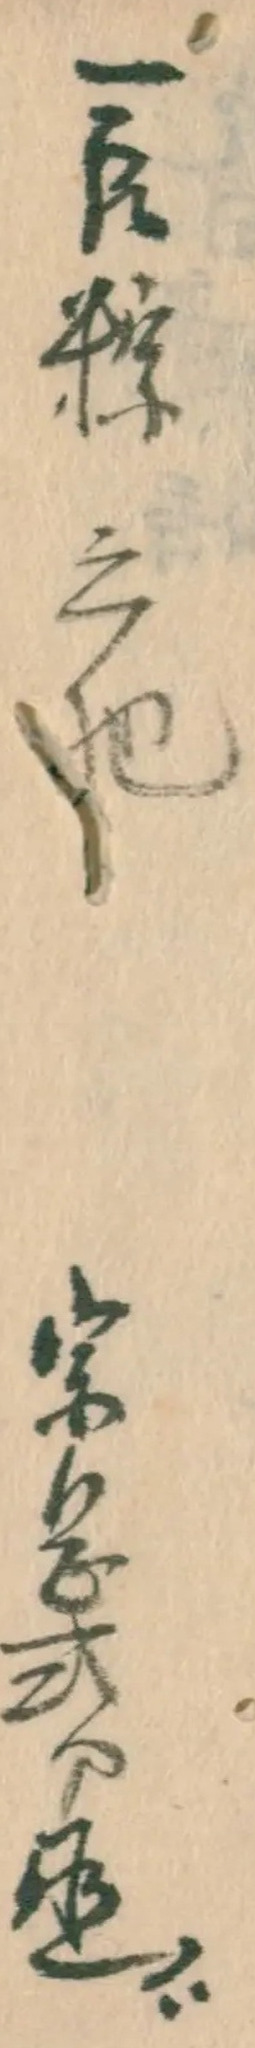一良粽三把宗岡式部丞ゟ
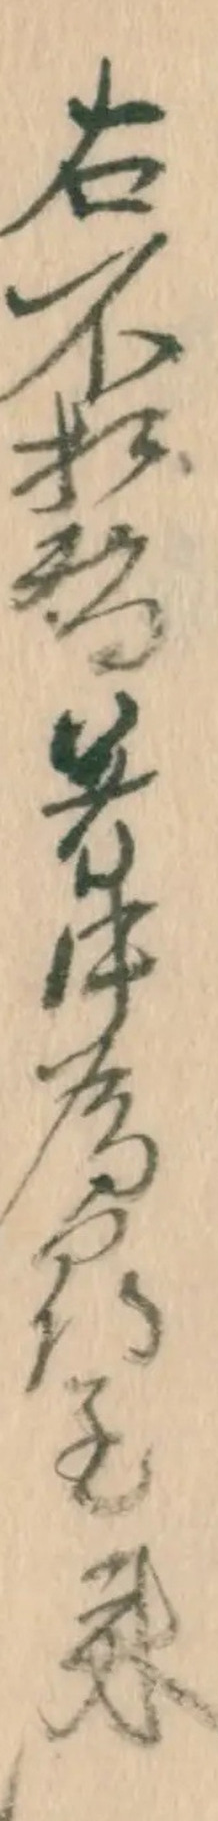右不相替書中為尋到来
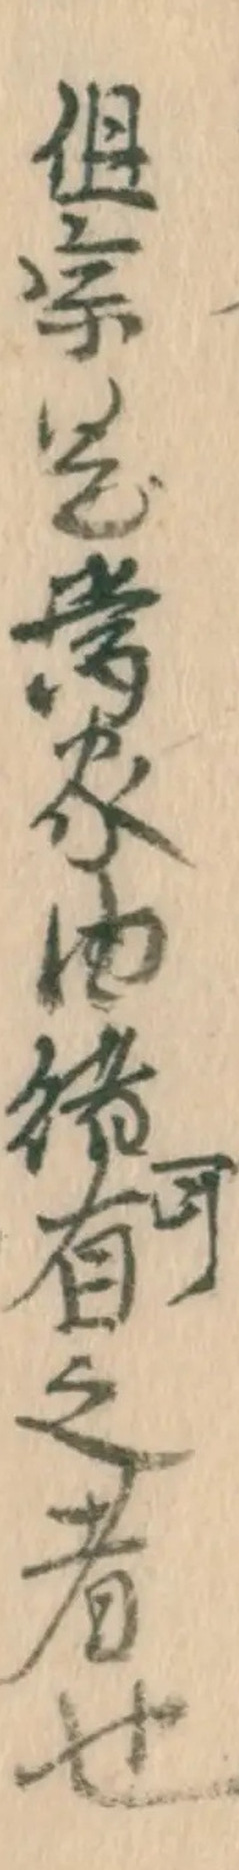但宗岡当家由緒可有之者也
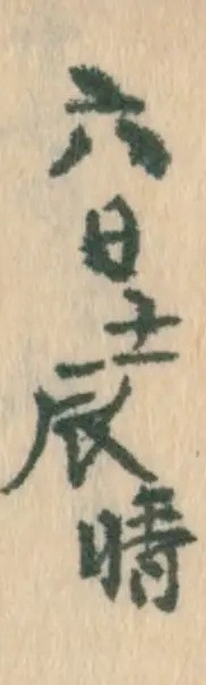六日壬辰晴
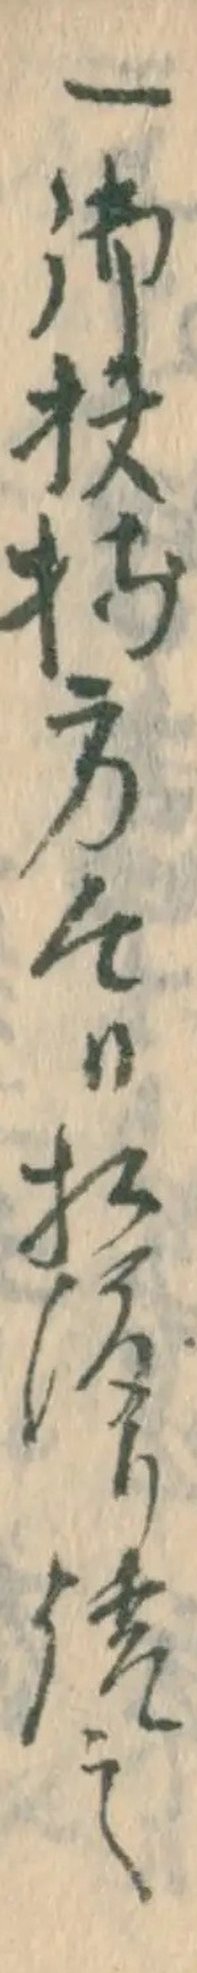一御扶持方今日相渡り請之

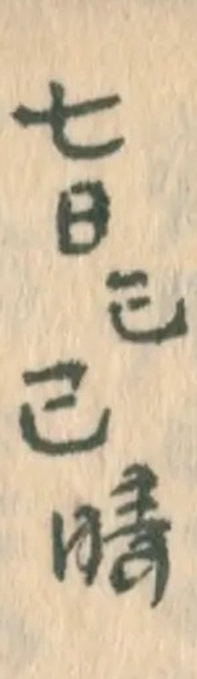七日己巳晴
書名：禁裏御所御用日記. [131]
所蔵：国立国会図書館 National Diet Library, JAPAN
